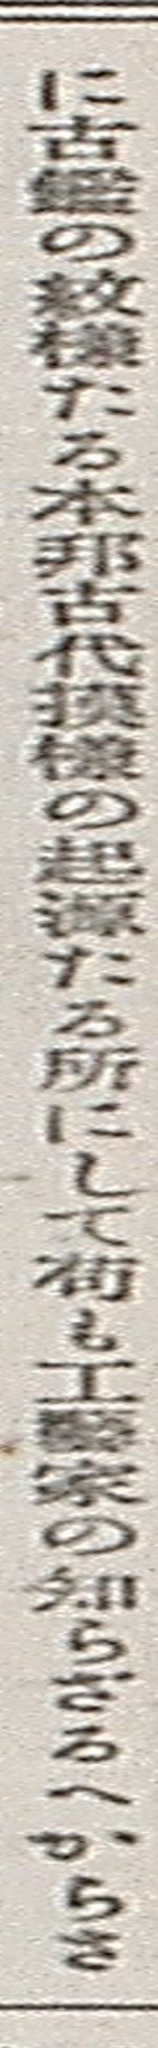に古鑑の紋様たる本邦古代模様の起源たる所にして苟も工芸家の知らざるへからさ
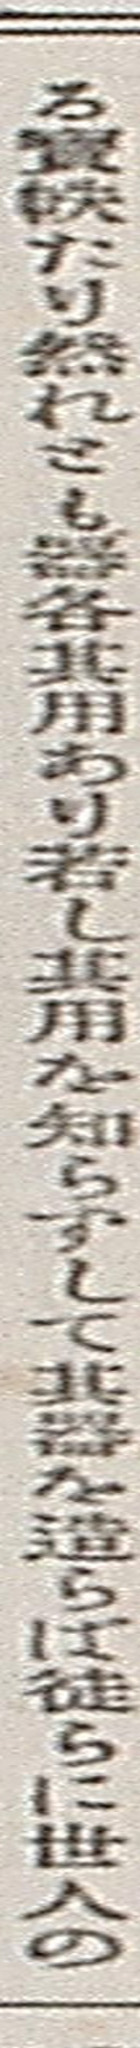る実缺たり然れとも器各其用あり若し其用を知らずして其器を造らば徒らに世人の
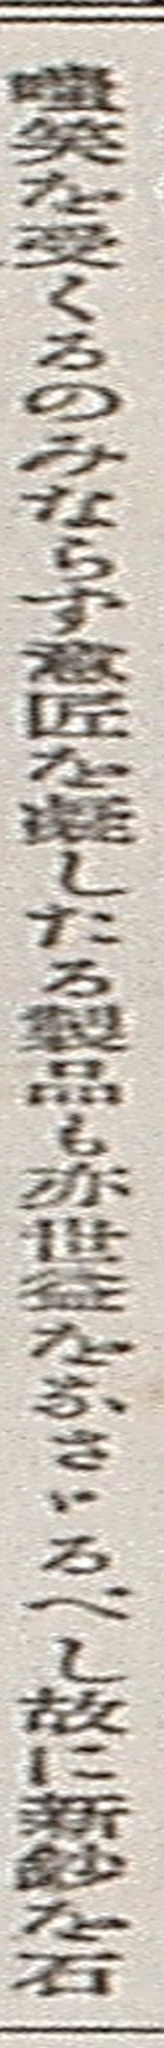嗤笑を受くるのみならず意匠を凝したる製品も亦世益をなさゞるべし故に新鈔を石
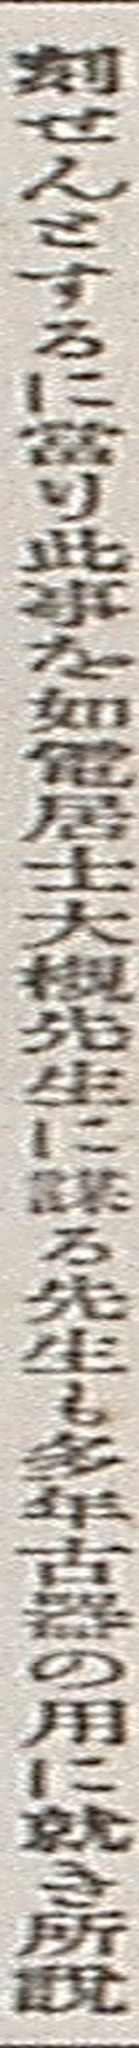刻せんとするに当り此事を如電居士大槻先生に謀る先生も多年古器の用に就き所説
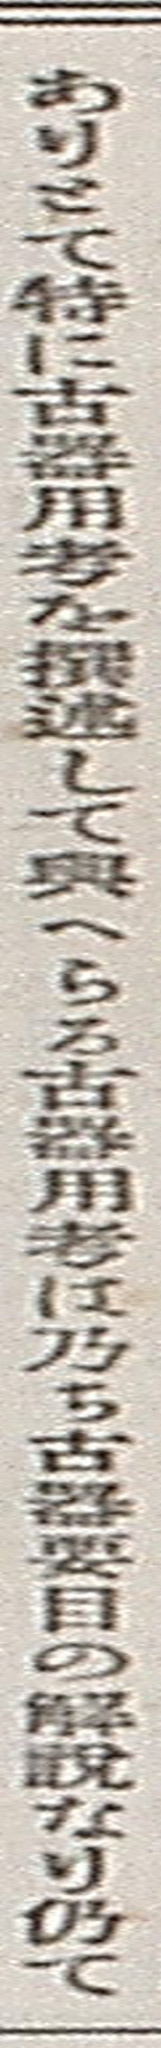ありとて特に古器用考を撰述して与へらる古器用考は乃ち古器要目の解説なり仍て
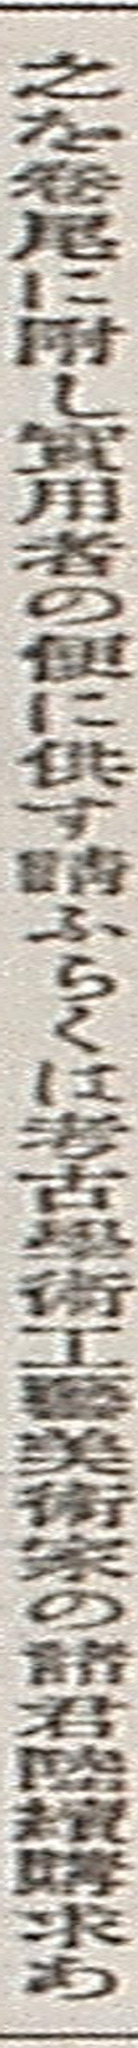之を巻尾に附し実用者の便に供す請ふらくは考古学術工芸美術家の諸君陸読購求あ
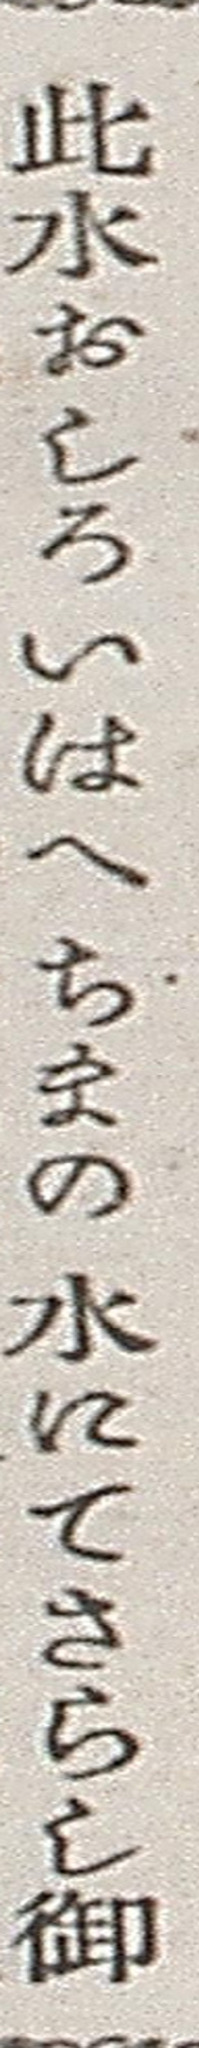此水おしろいはへちまの水にてさらし御
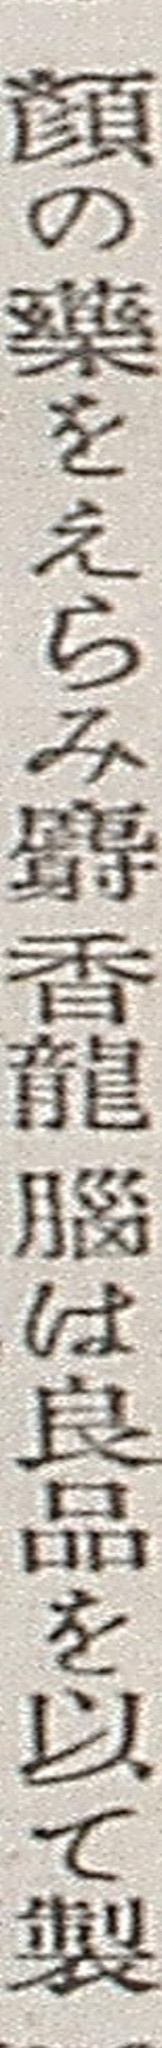顔の薬をえらみ麝香龍脳は良品を以て製
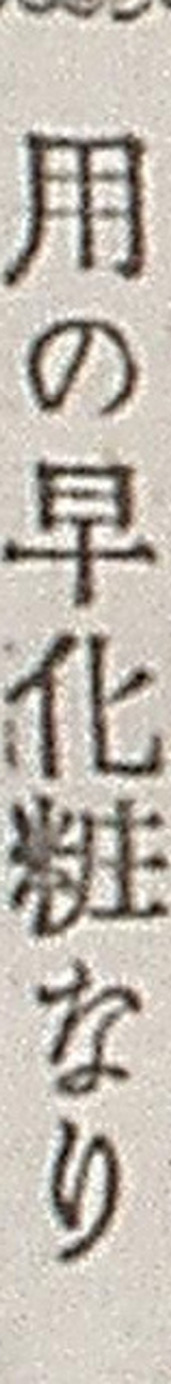用の早化粧なり
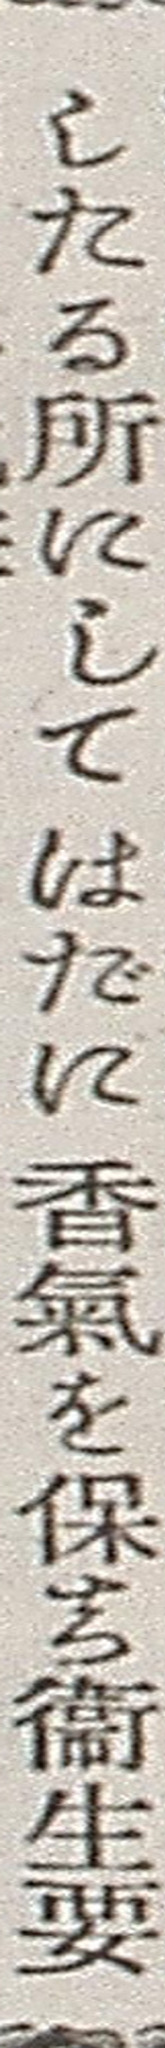したる所にしてはだに香気を保ち衛生要
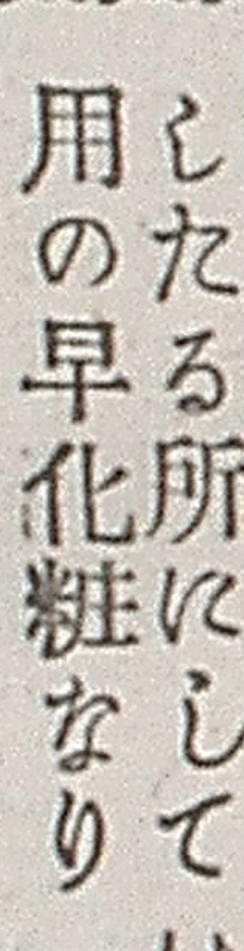用の早化粧なり
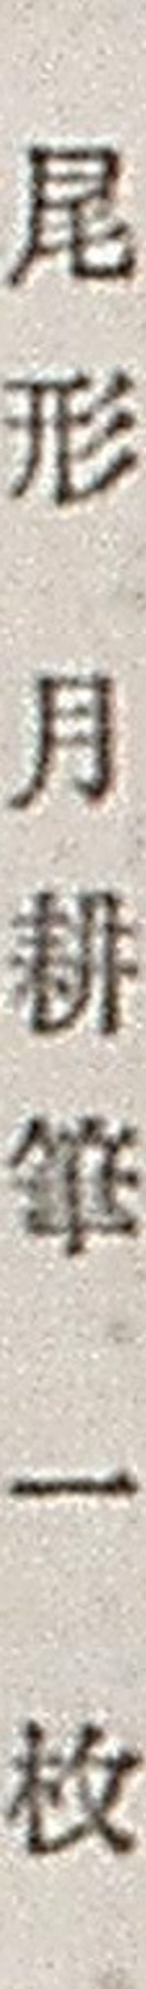尾形月耕筆一枚
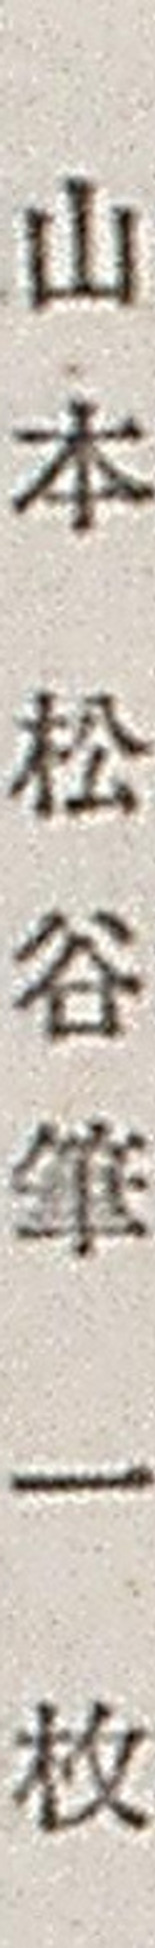山本松谷筆一枚
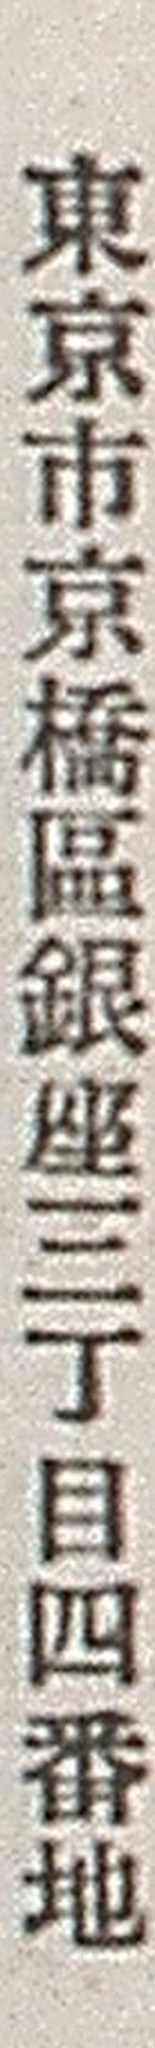東京市京橋区銀座三丁目四番地
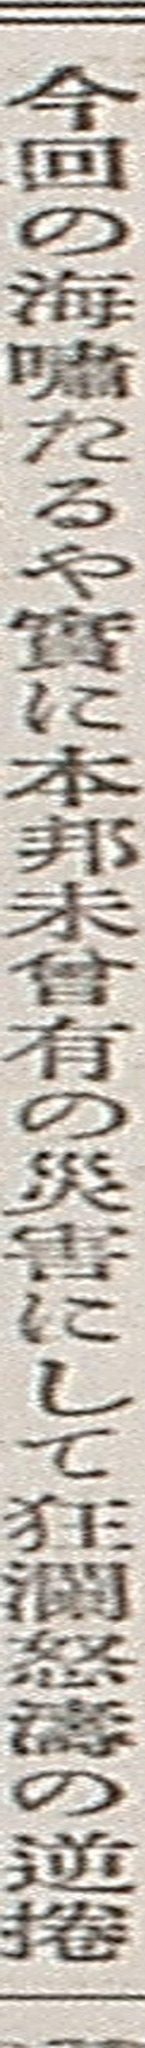今回の海嘯たるや実に本邦未曾有の災害にして狂瀾怒濤の逆捲
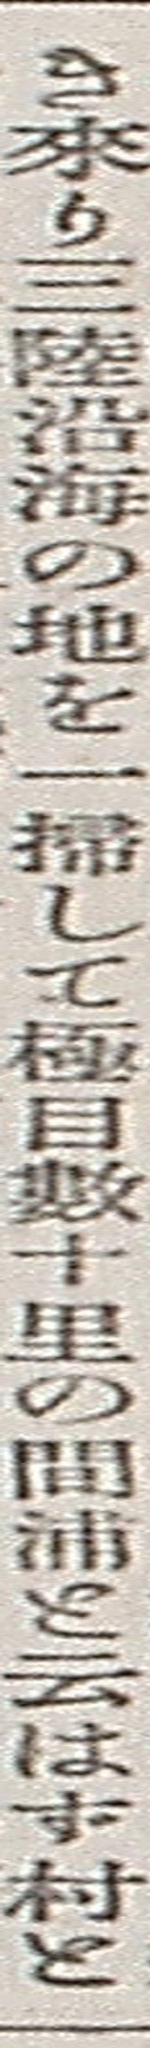き来り三陸沿岸の地を一掃して極目数十里の間浦と云はず村と
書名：風俗畫報臨時増刊第百二十號　大海嘯被害録（下）
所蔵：東京大学地震研究所図書室 Earthquake Research Institute Library, The University of Tokyo, JAPAN
